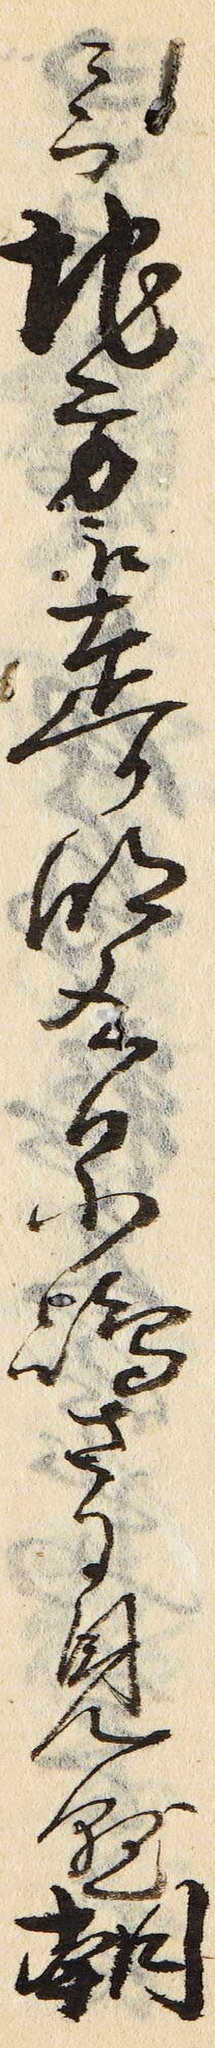ニ而地方江走り明九日小嶋さる見懸朝
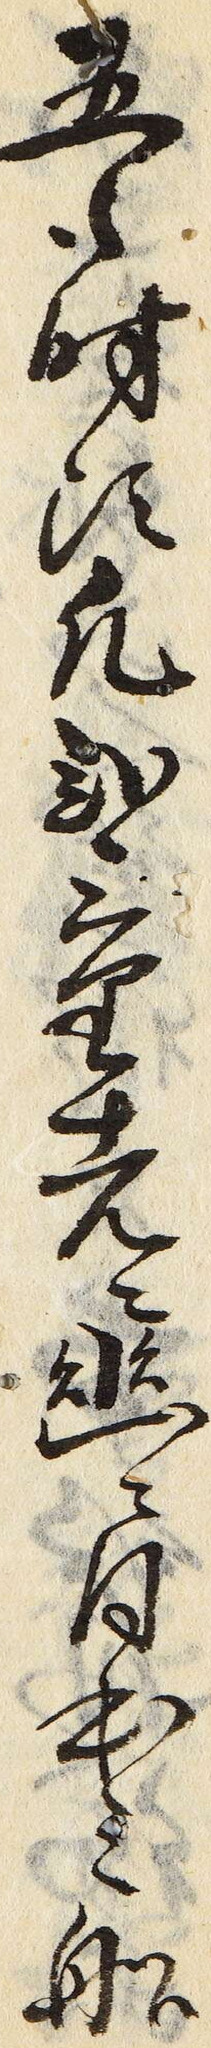五ツ時頃凡弐三里先ニ幽ニ日本之船
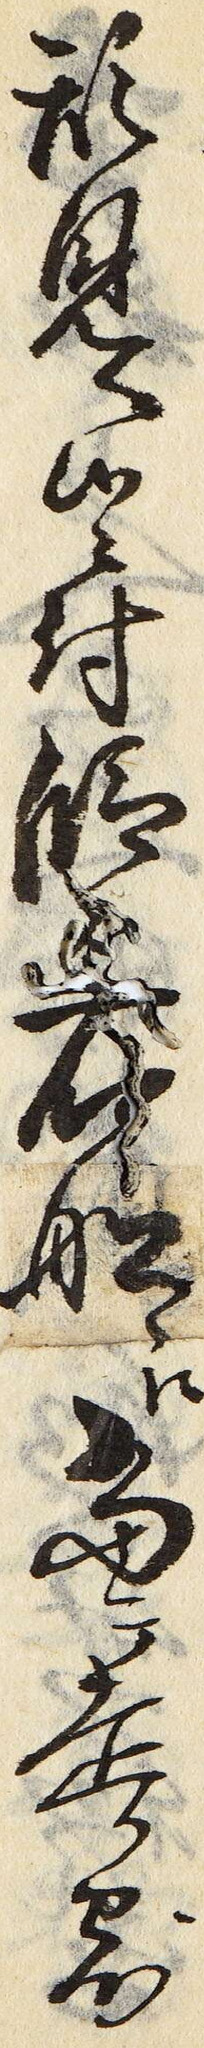形見へ候ニ付段々右船え当テ走り寄
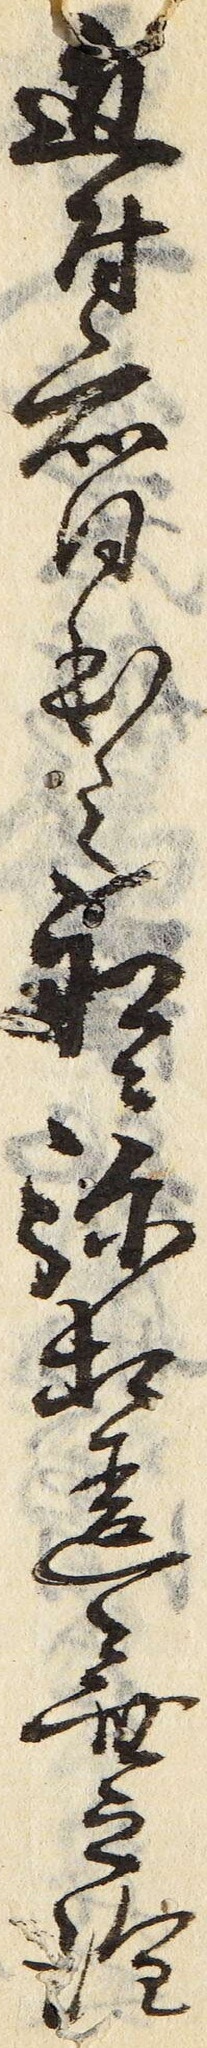近付候所日本之船ニ弥相違無之注
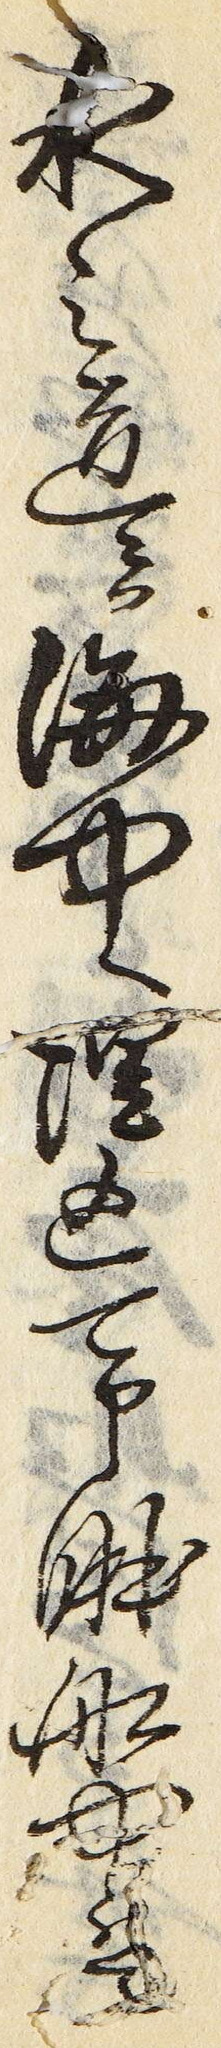水之道ニ而海中へ埋込可申体船中は
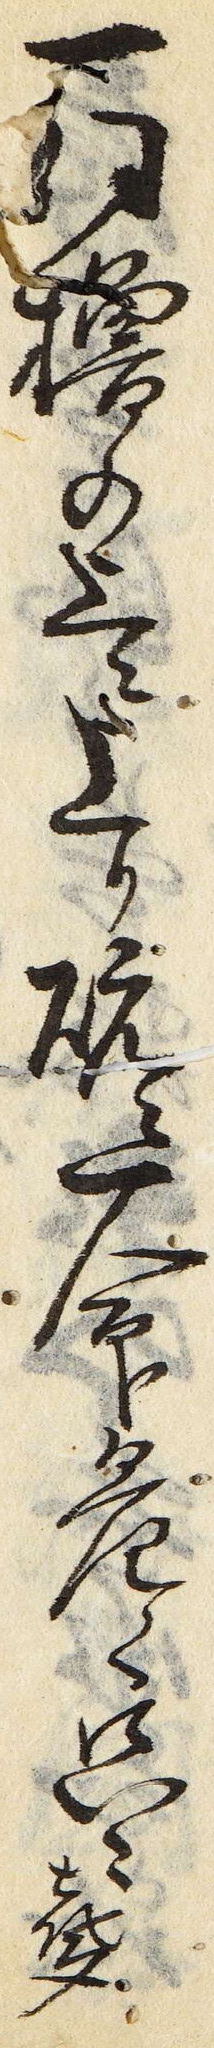一同櫓の上ニ上り既ニ一命危く只々声
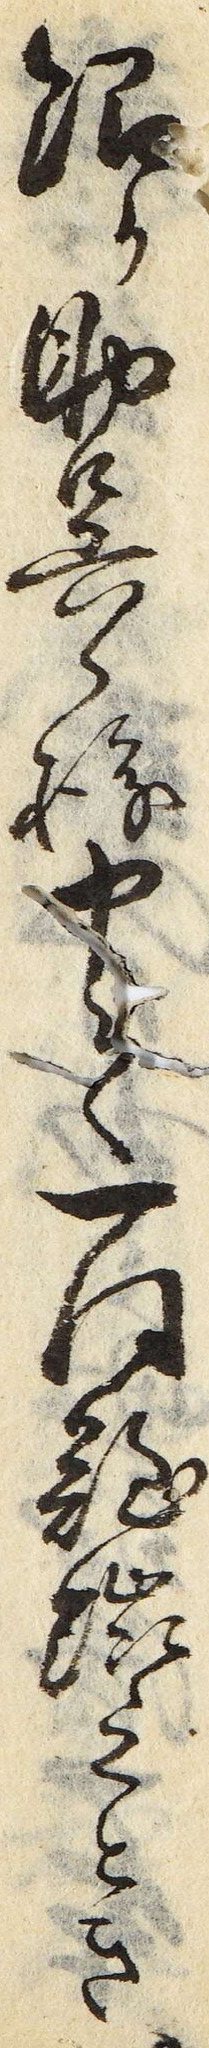限り助呉候様申て一同難渋候ごとき
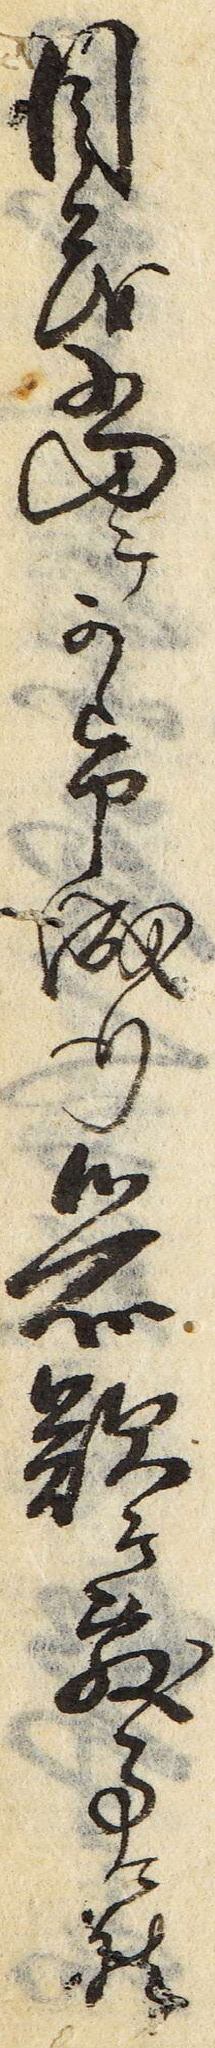目も当テ不被申成行候所歎ケ敷事ニ候

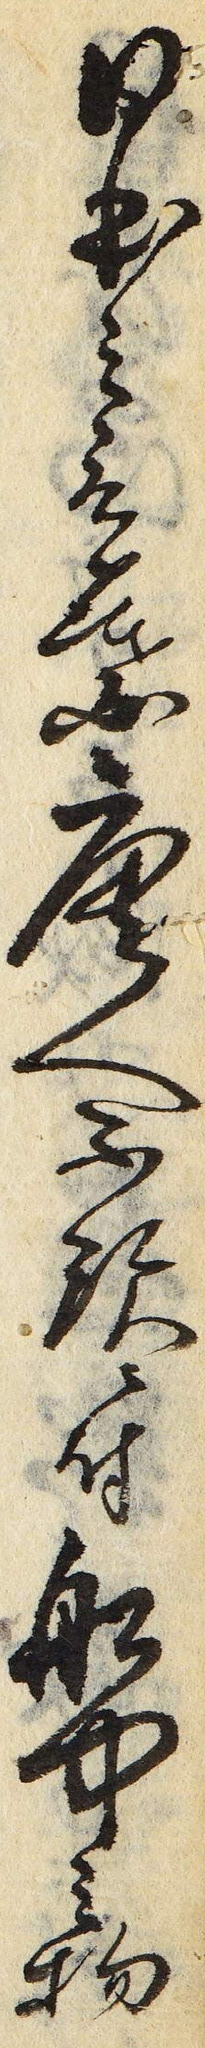日本之言葉唐人不訳ニ付船中之物
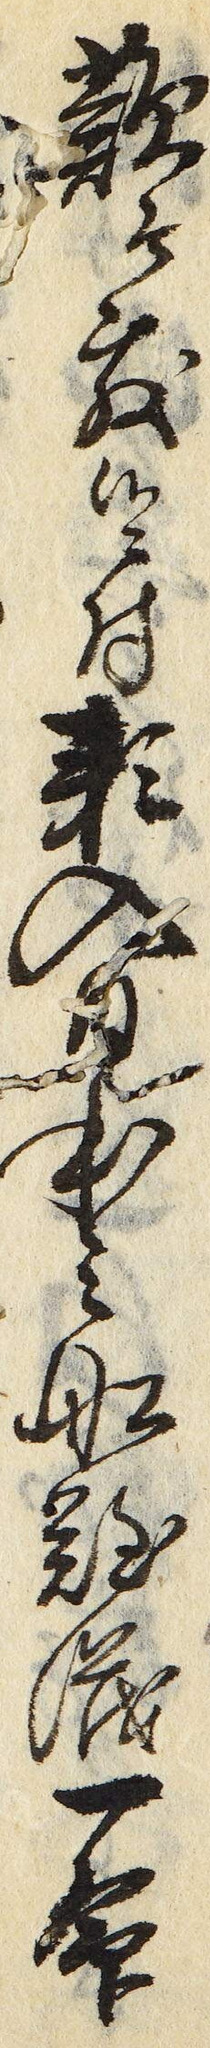歎ケ敷候ニ付頼入日本之船難儀一命
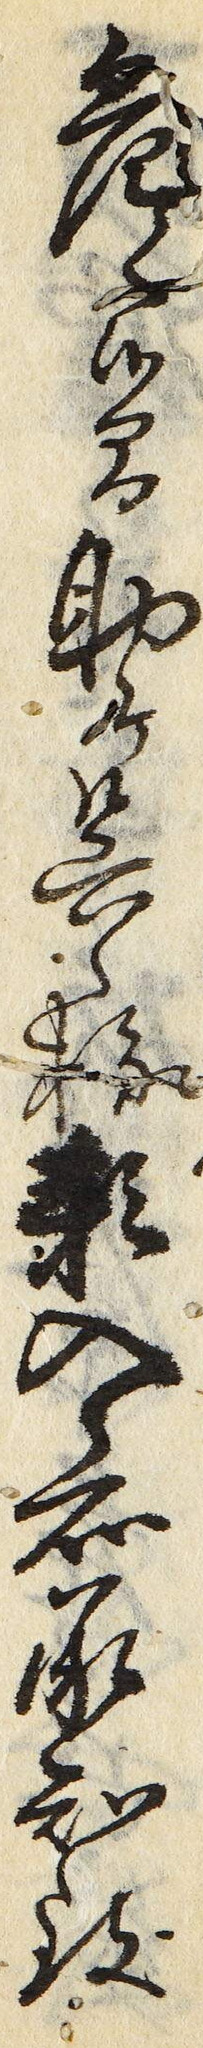危く候間助ケ呉候様頼入候所承知致
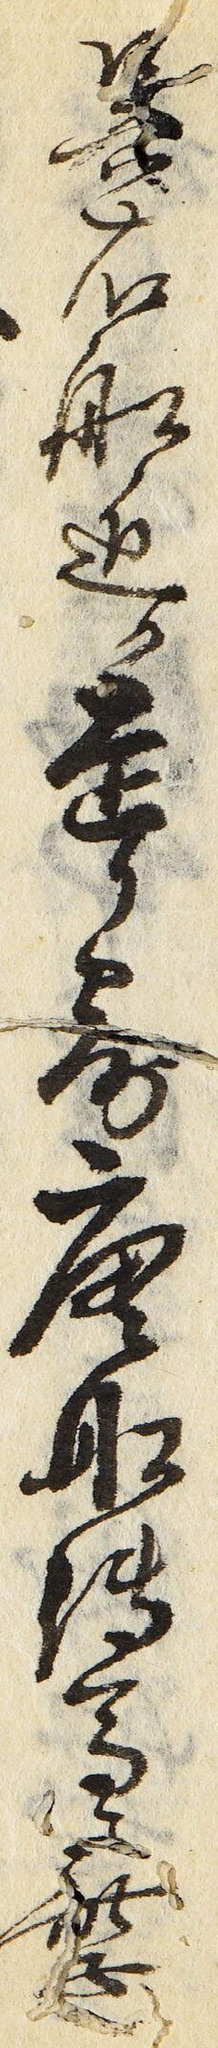呉右船近ク走り寄唐船伝馬ニ乗
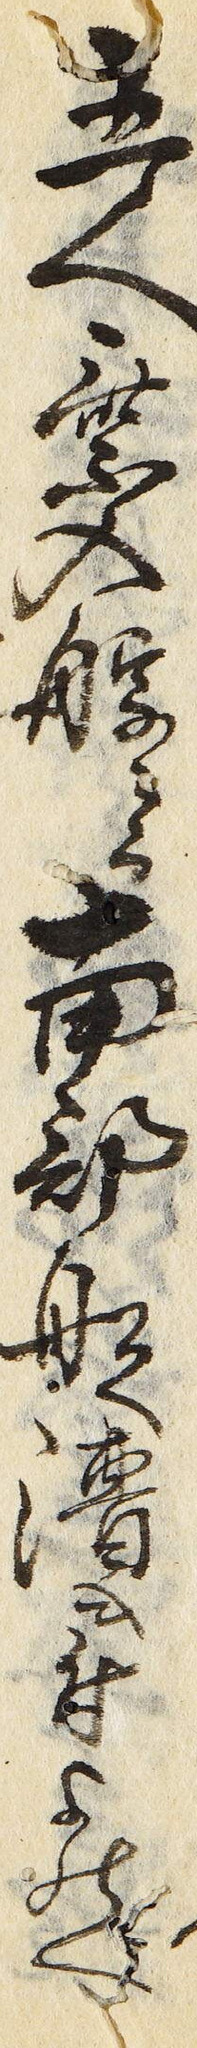五人乗入艀ニ而南部船へ漕キ付よの〳〵？
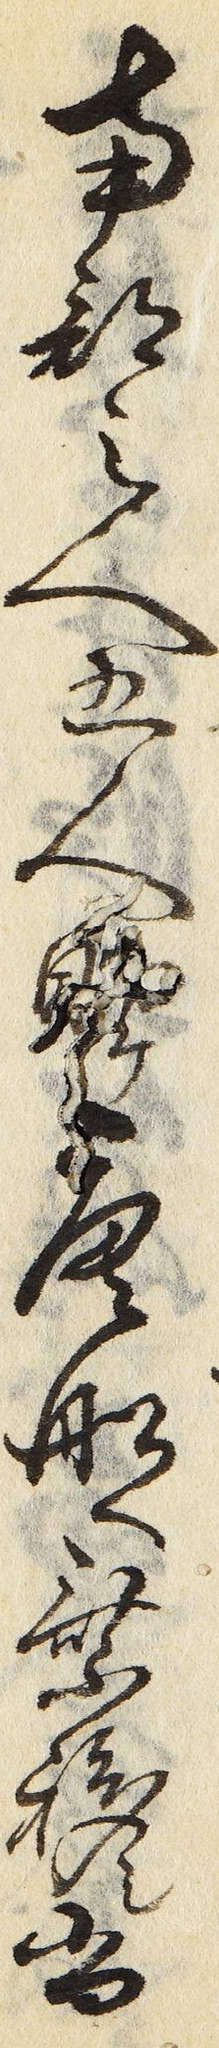南部之人五人助ケ唐船へ乗移シ尚
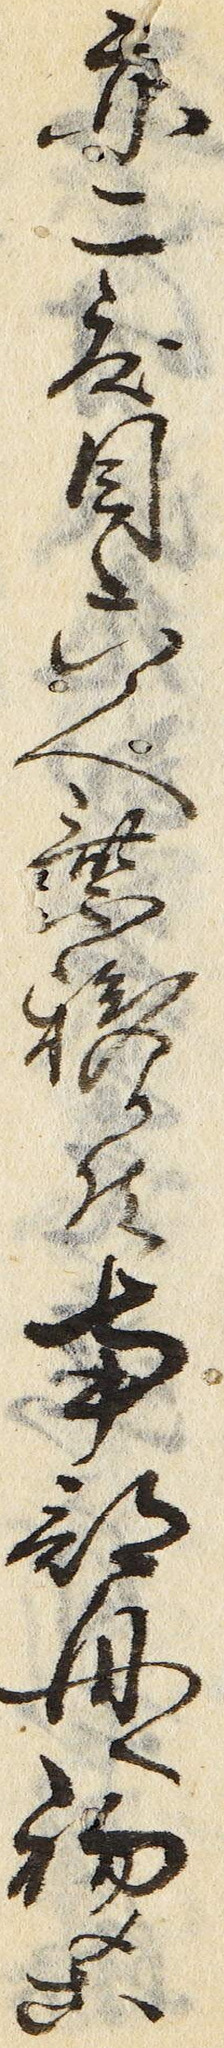亦二度目六人乗移り候南部舟へ初メこ
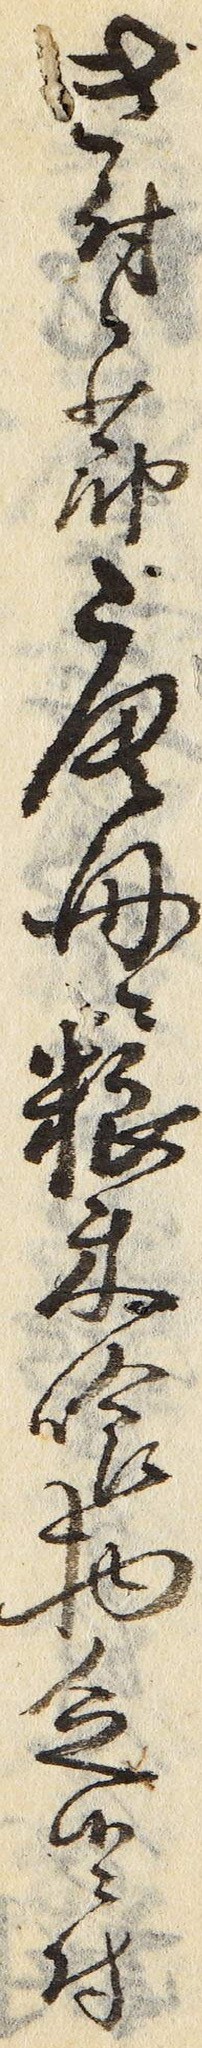ぎ付候節唐舟ニ粮米喰物乏候ニ付
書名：阿波幸宝丸漂流記
